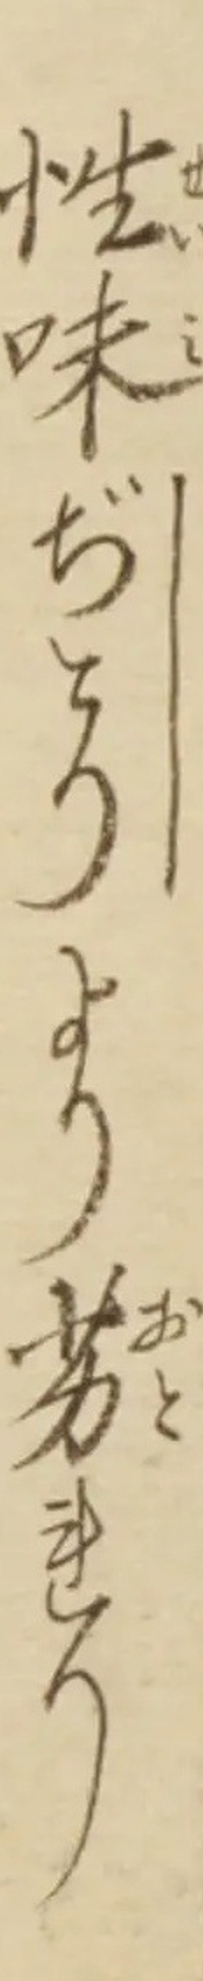性味ぢとりより劣れり
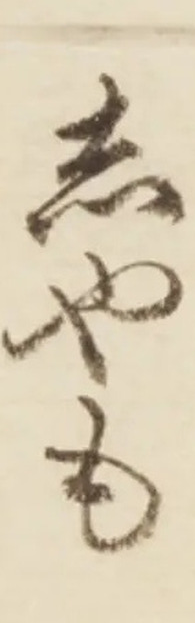しやも

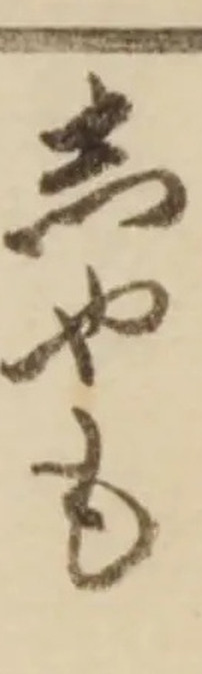しやも
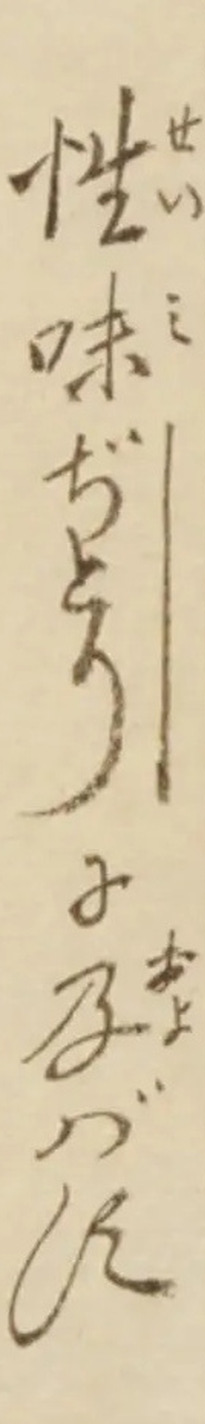性味ぢとりに及ばす

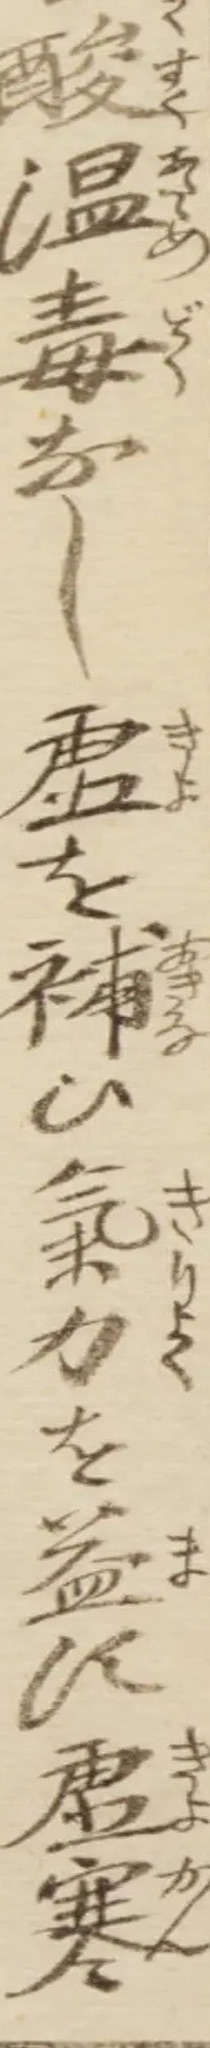味甘酸温毒なし虚を補ひ気力を益す虚寒
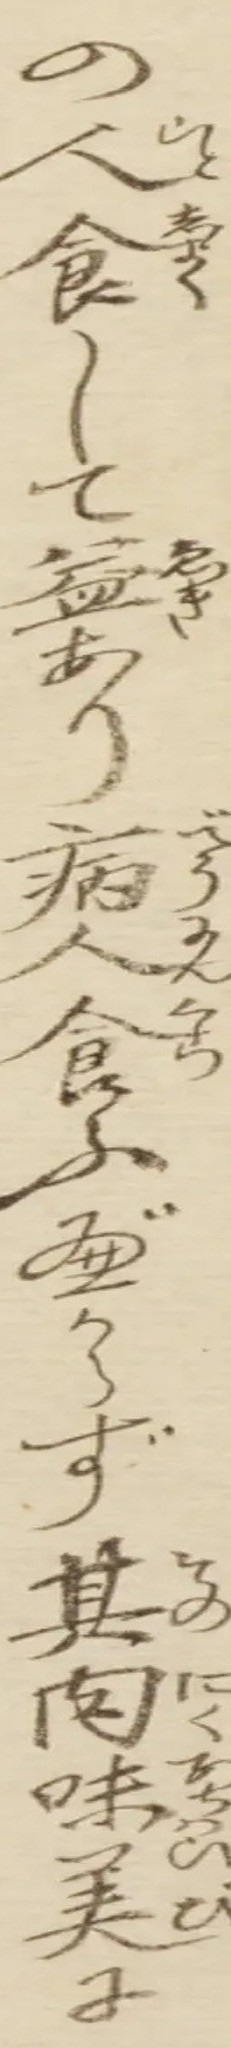の人食して益あり病人食ふべからず）其肉味美に
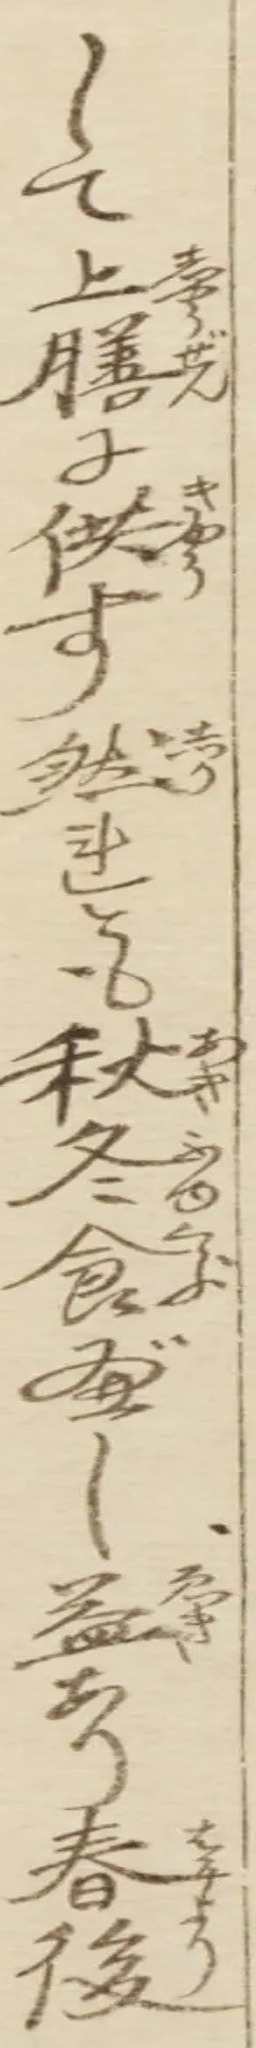して上膳に供す然れとも秋冬食べし益あり春後
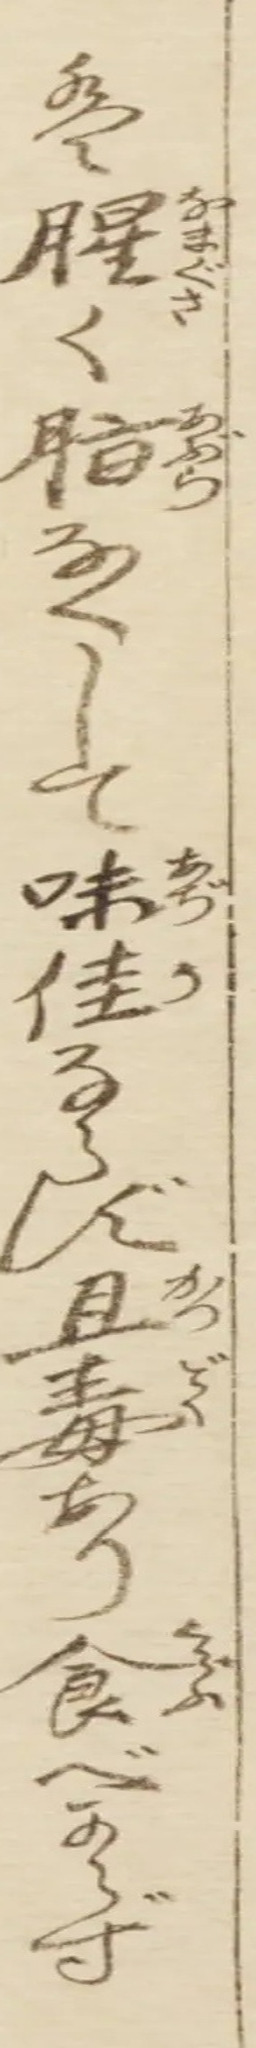は腥く脂なくして味佳ならず且毒あり食べからず
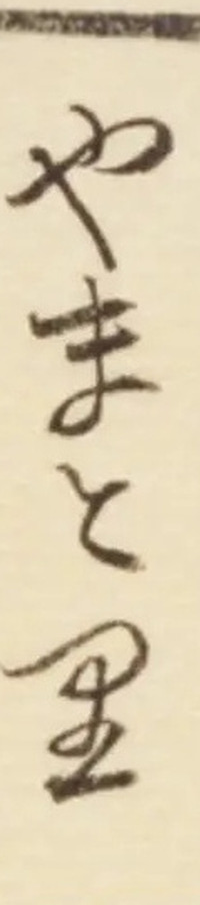やまとり

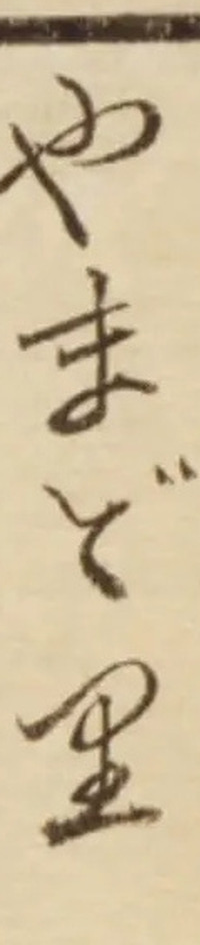やまどり
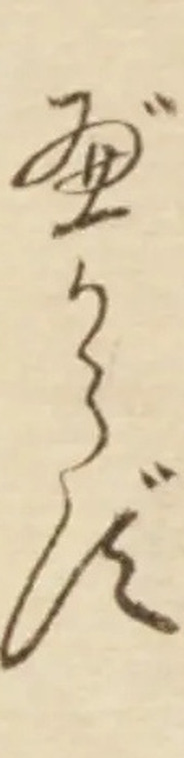べからず

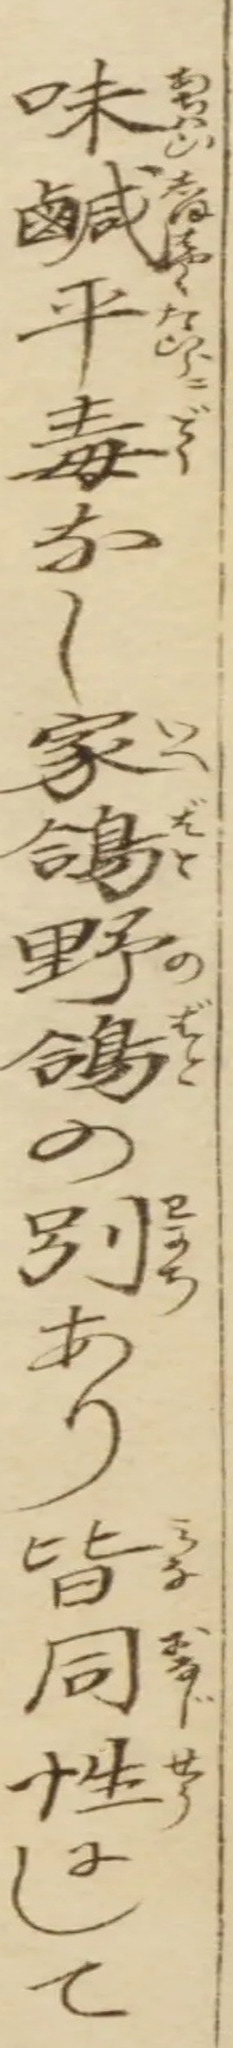味鹹平毒なし家鴿野鴿の別あり皆同性にして
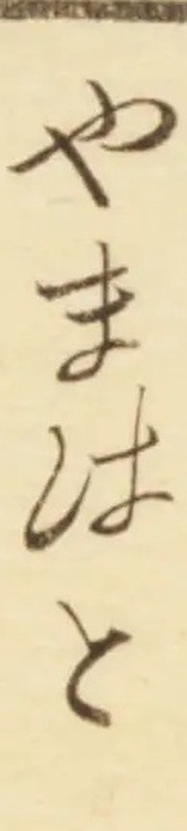やまはと

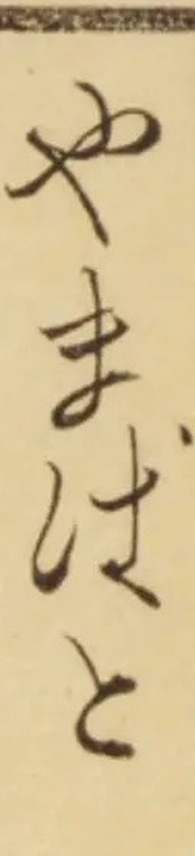やまばと
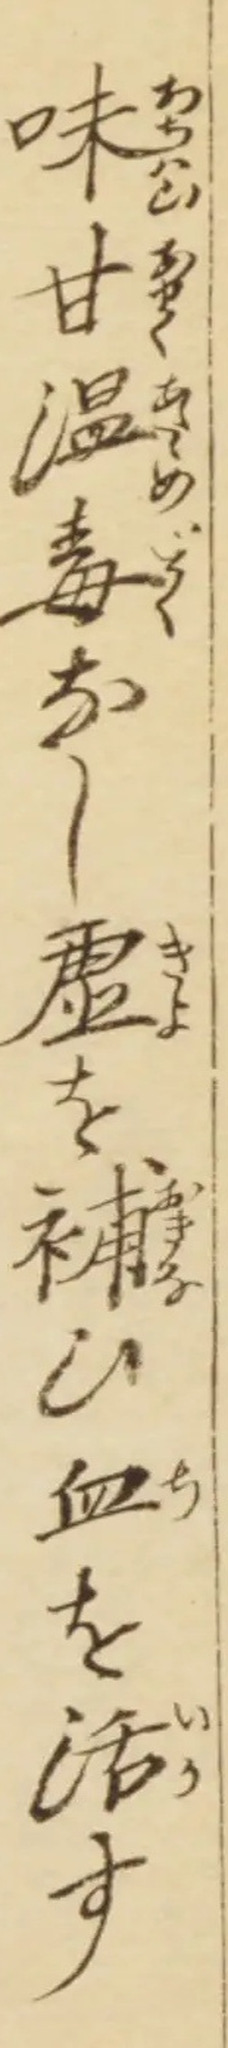味甘温毒なし虚を補ひ血を活す
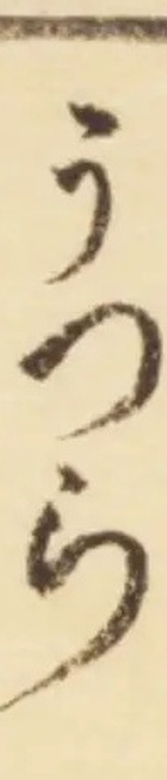うつら
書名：華鳥譜
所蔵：国立国会図書館 National Diet Library, JAPAN
